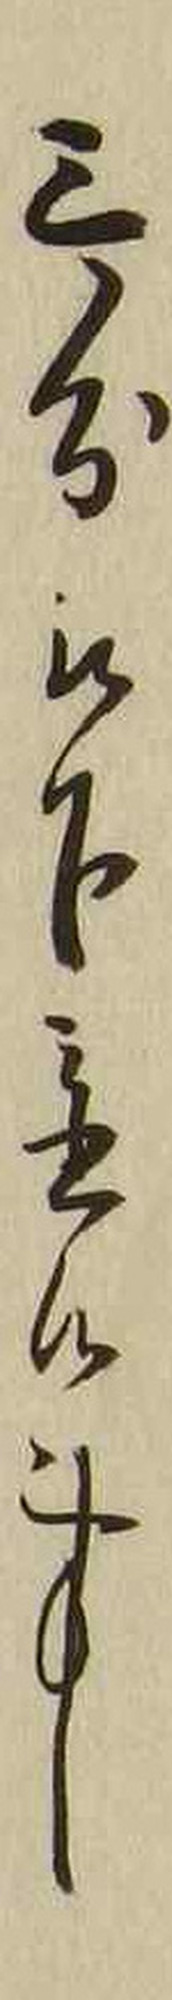三分被下置候事
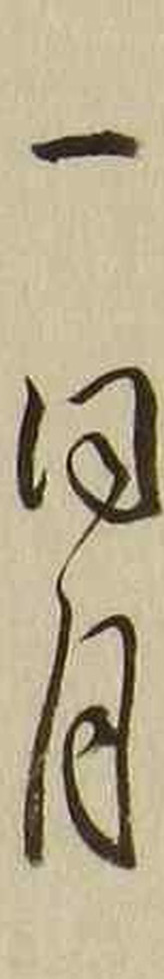一同月
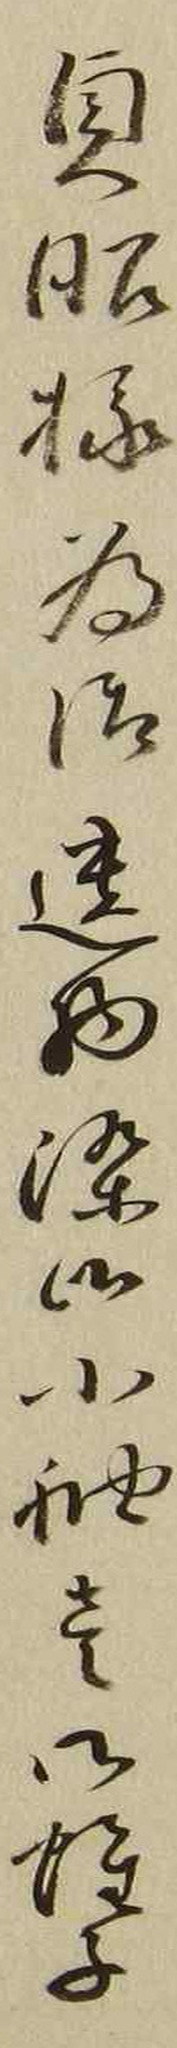貞昭様為御遺物染御小袖壱御帷子
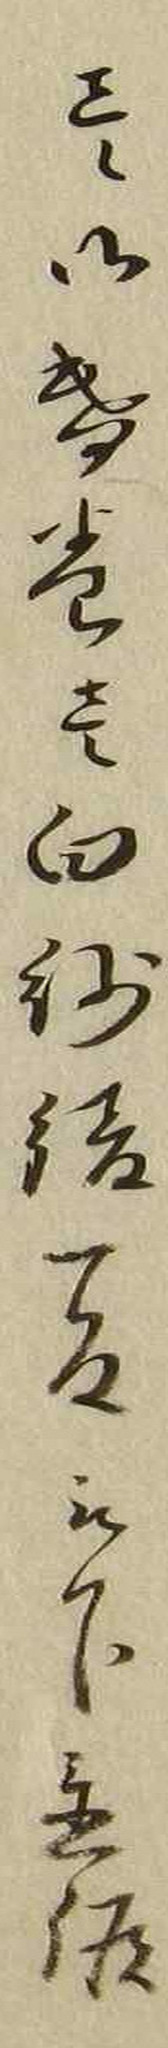壱御替巻壱白紗綾一反被下置候
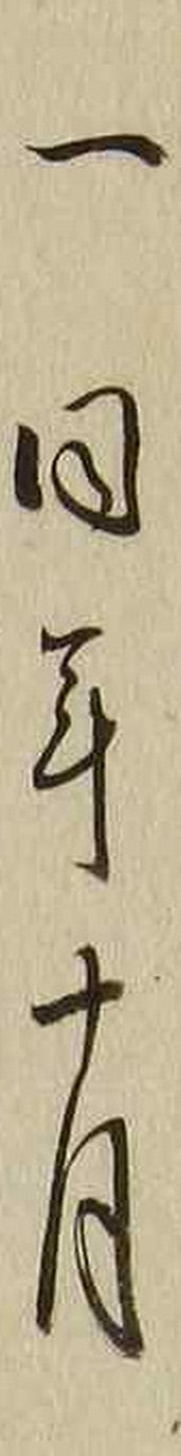一同年十月
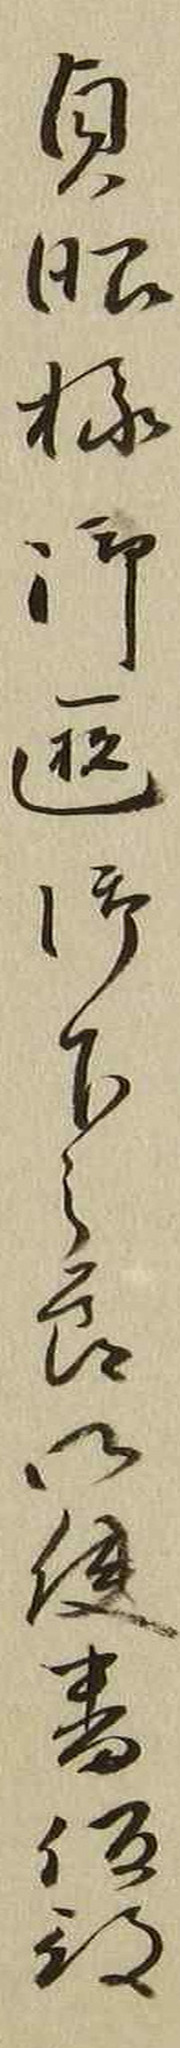貞昭様御柩御下之節御使番仮役
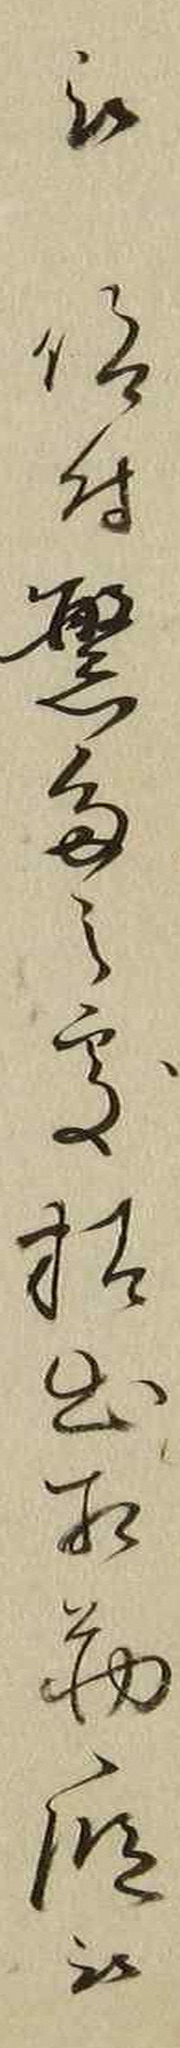被仰付繁多之処精出相勤候段被
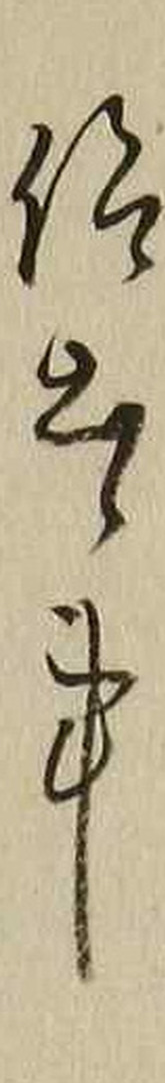仰出候事
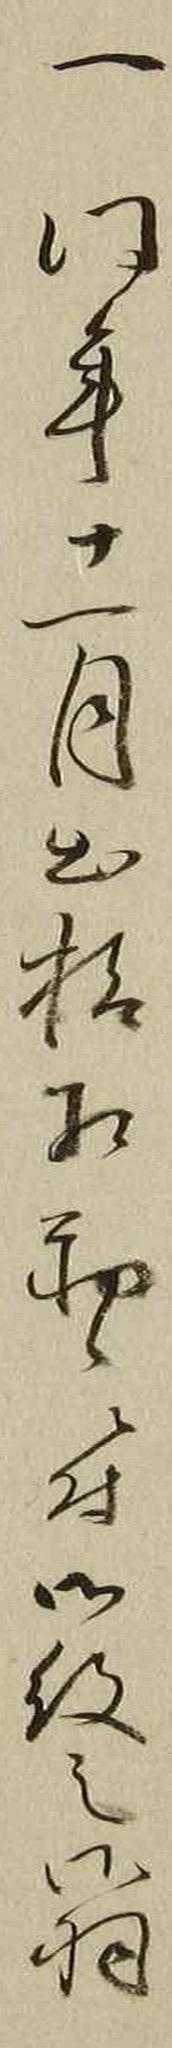一同年十一月出精相勤候ニ付御紋之御羽
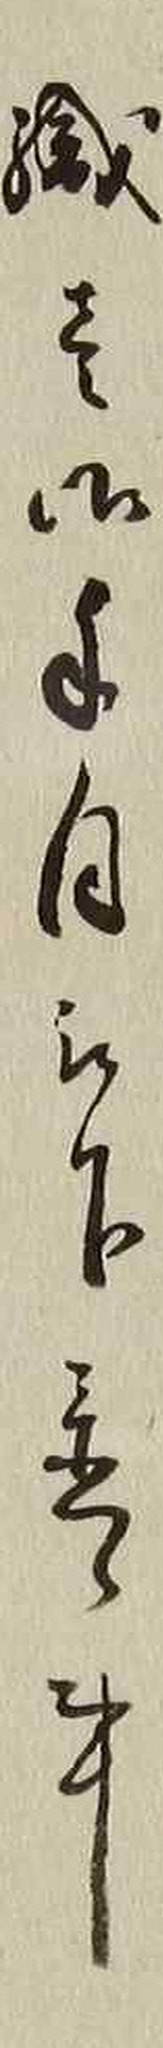織壱御手自被下置候事
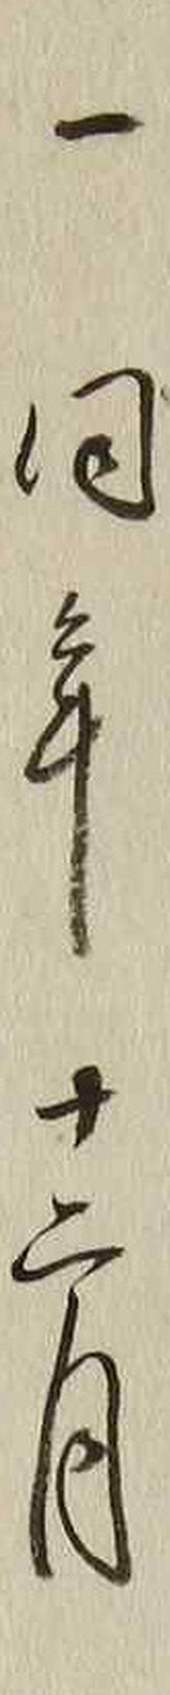一同年十二月
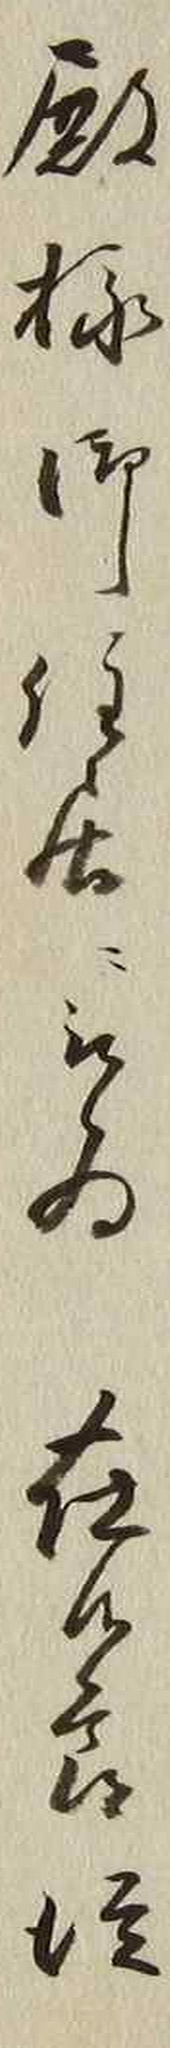殿様御住居ニ被為在候節従
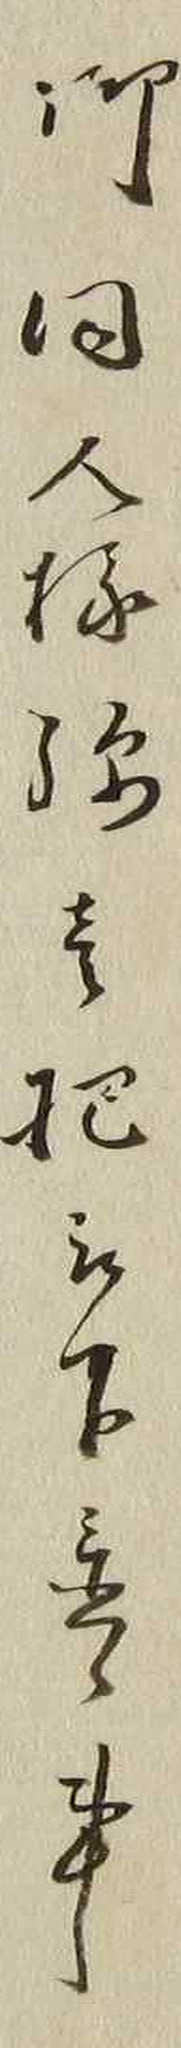御同人様綿壱把被下置候事
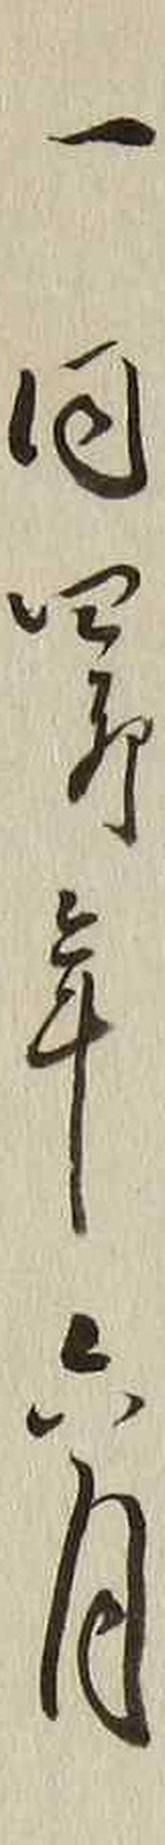一同四卯年六月
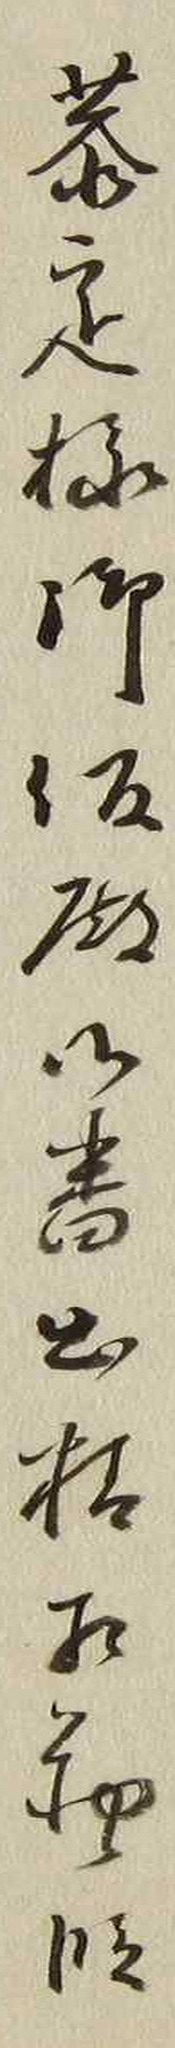恭定様御仮殿御番出精相勤候段
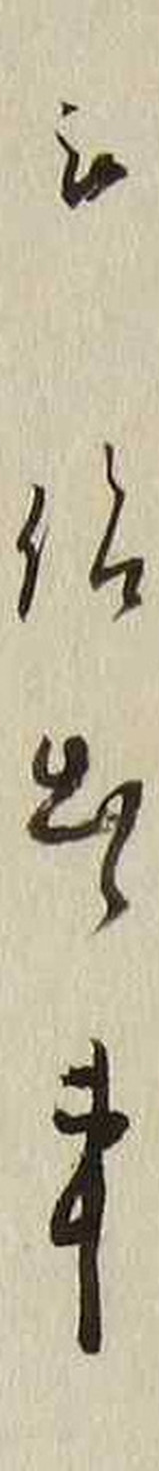被仰出候事
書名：諸士系譜　巻之25　い之部25
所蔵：会津若松市立会津図書館
